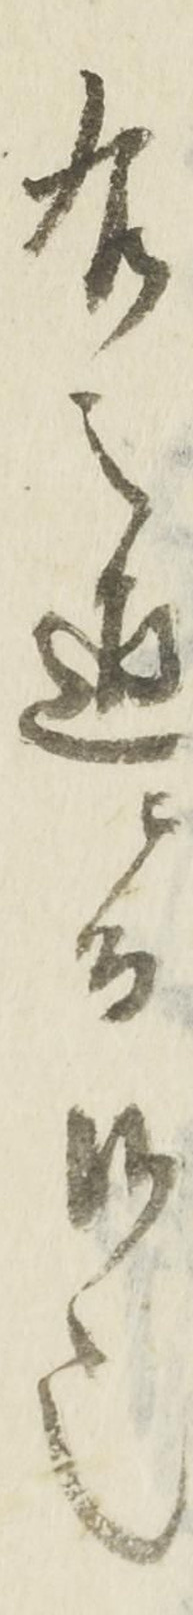右之通ニ而候也
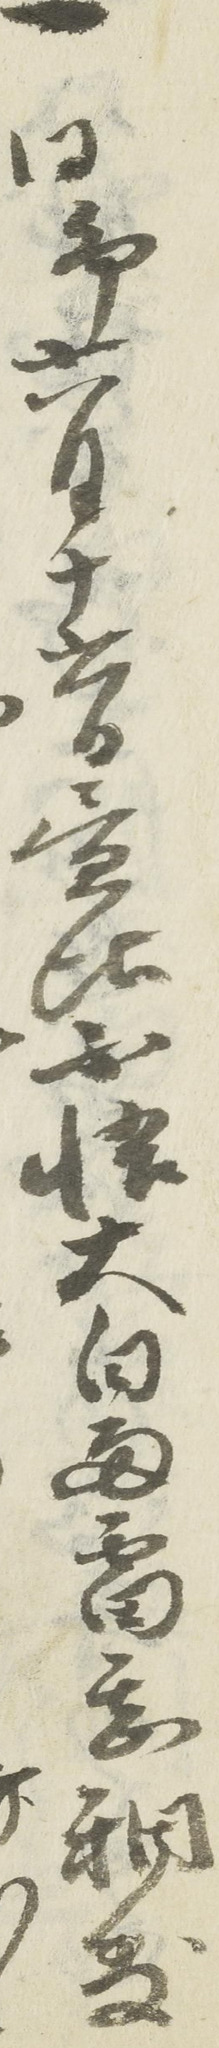一同卯六月十六日昼比不快大白雨雷雨甚稠敷
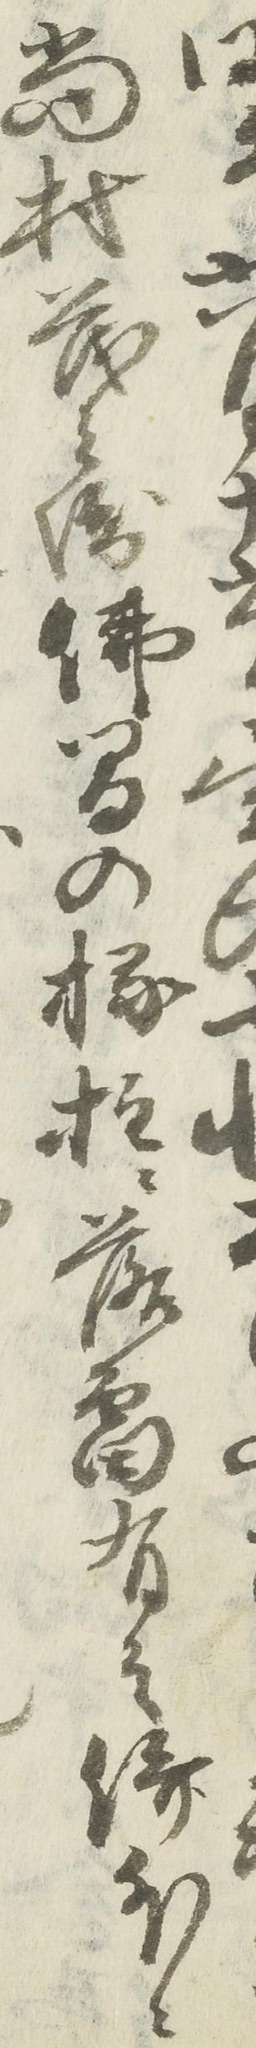当村茂兵衛仏間の縁柱ニ落雷有之併外ニ
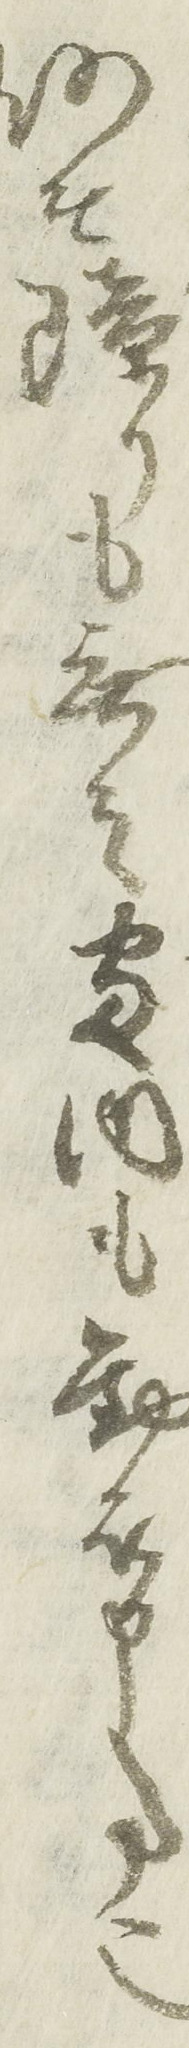何そ障りも無之家内も動被申事也
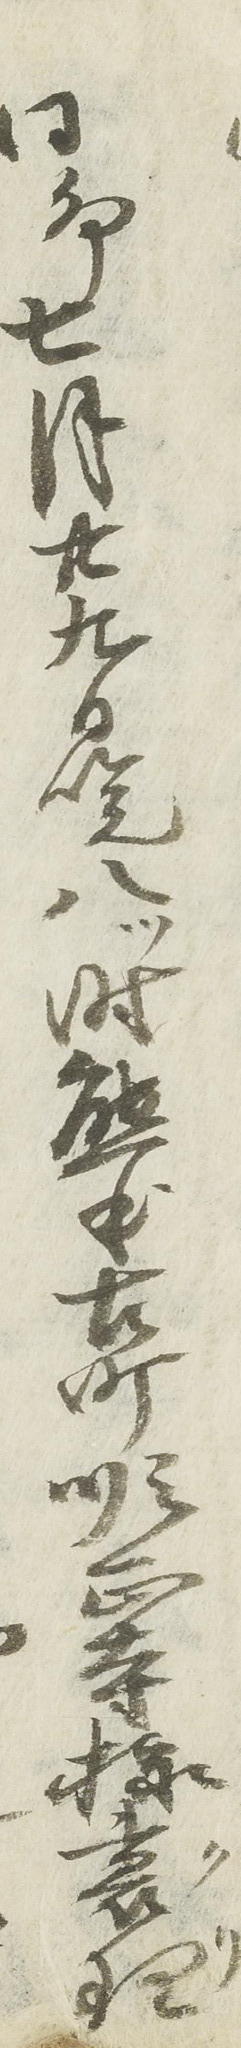一同卯七月廿九日暁八ツ時熊本古町順正寺様裏理
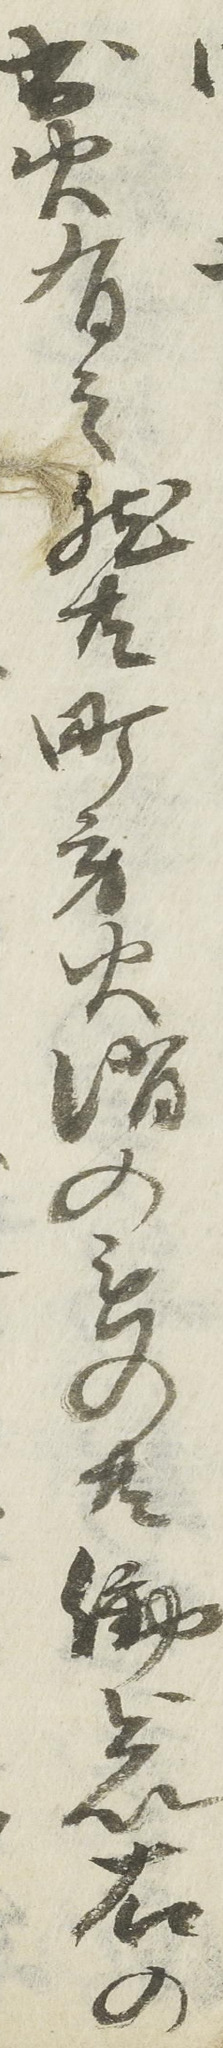出火有之然共町方火消のもの共働を以右の
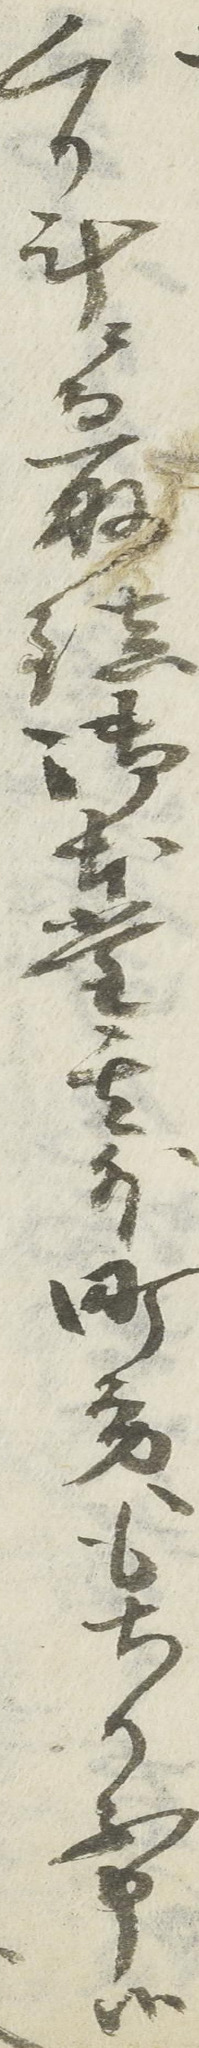くり計二而取鎮御本堂其外町方へもちり不申候
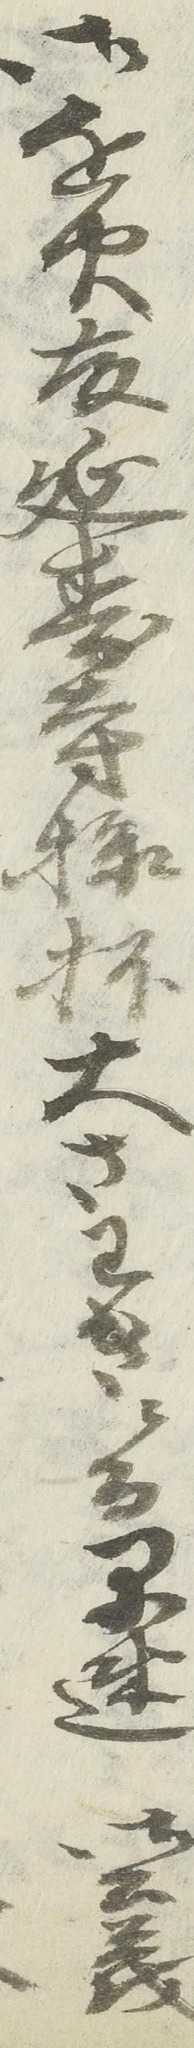御近火故延壽寺様抔大さわきニ而早速御公義
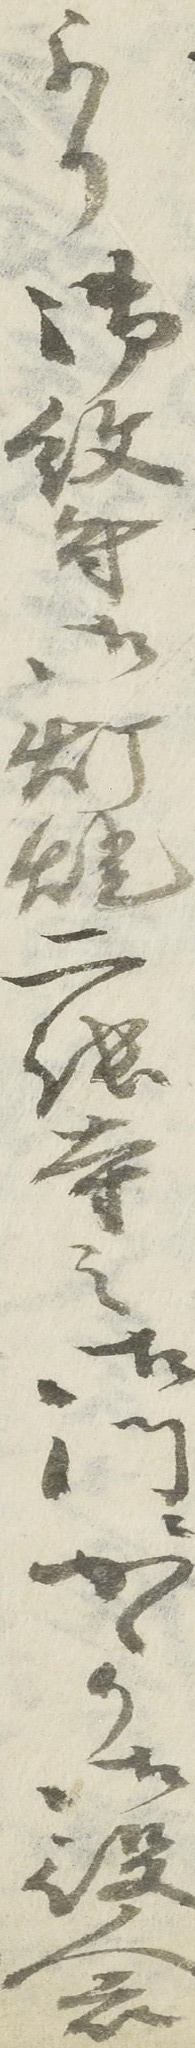より御紋付御提燈二張寺之御門ニかかり御役人衆
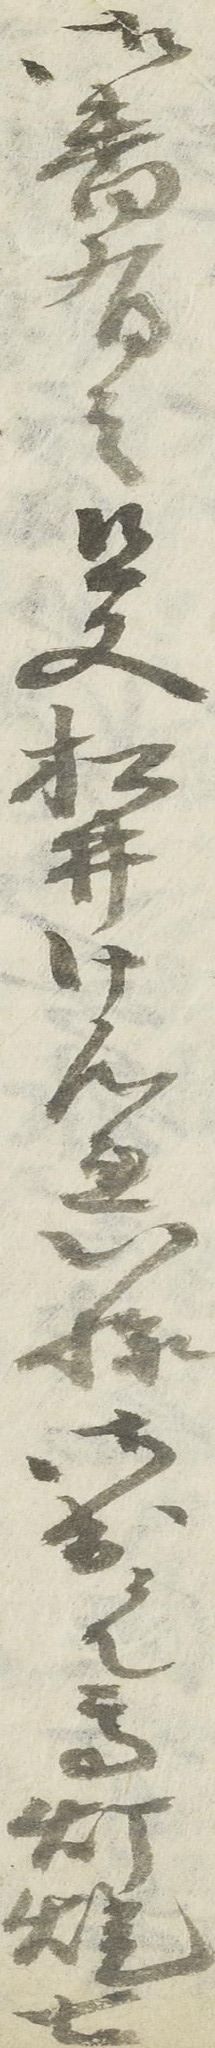御番有之且又松井けんまい様御出ニて高提燈七
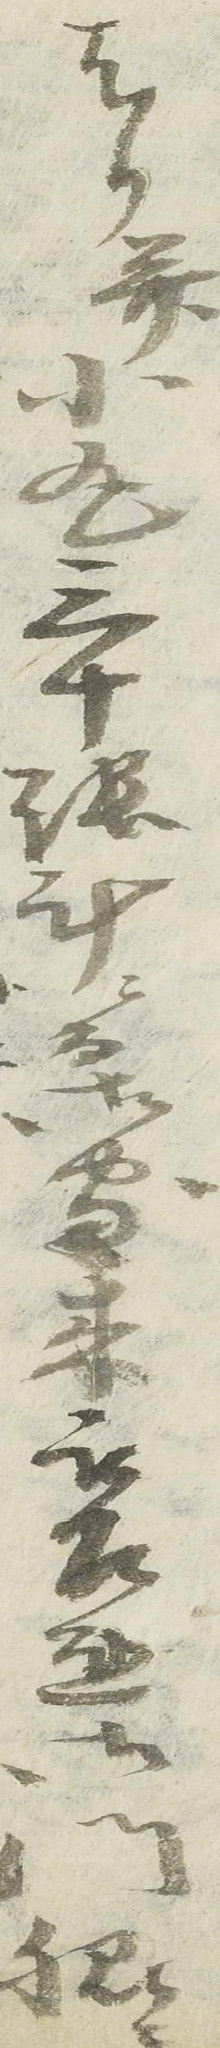はり并小丸三十張計ニ而御家来被召連御門脇ニ
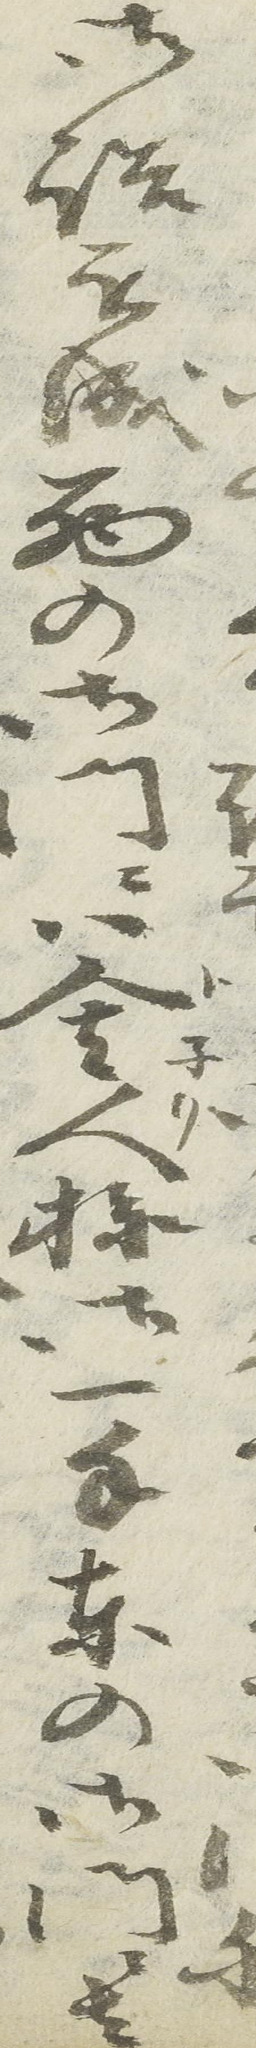御詰被成西の御門ニは舎人様御一手東の御門ニは
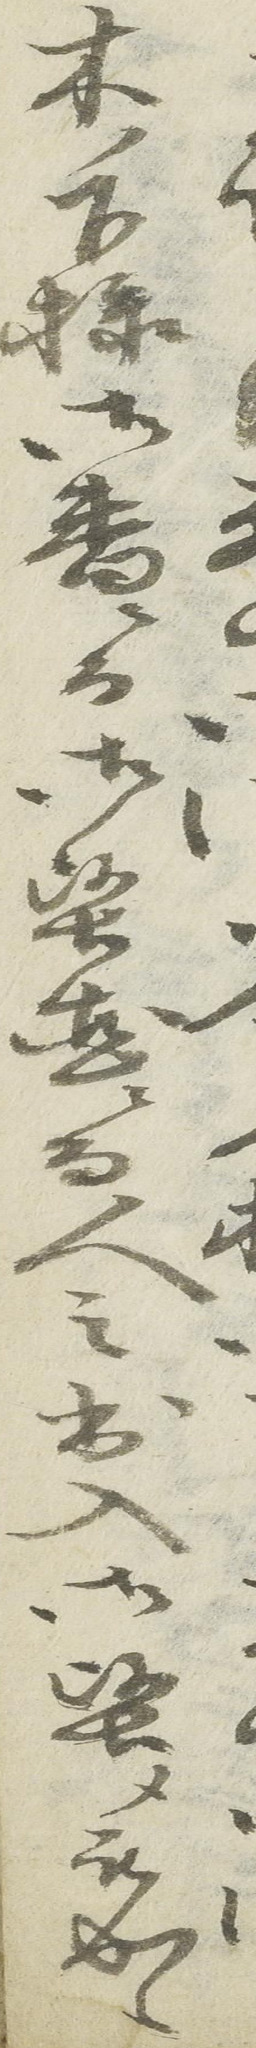木ノ下様御番ニ而御堅固ニ而人之出入御堅メ被成候

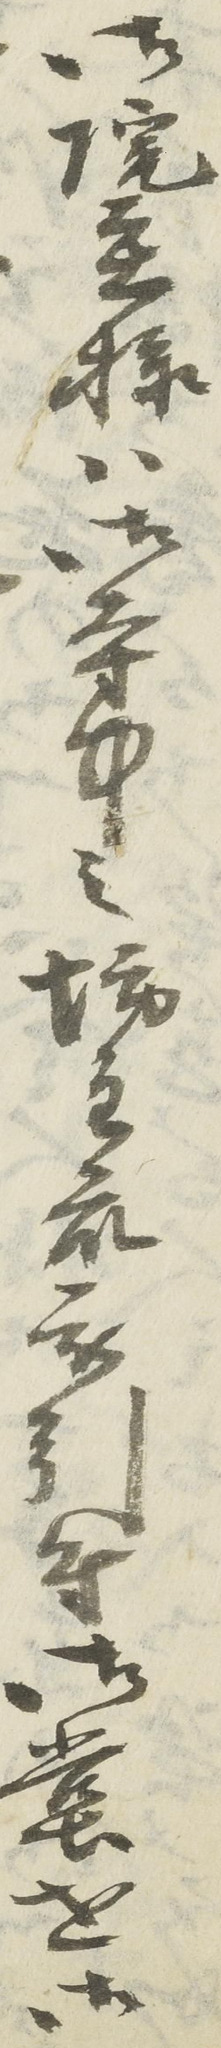御院主様は御寺中之坊主衆被引付御堂を御
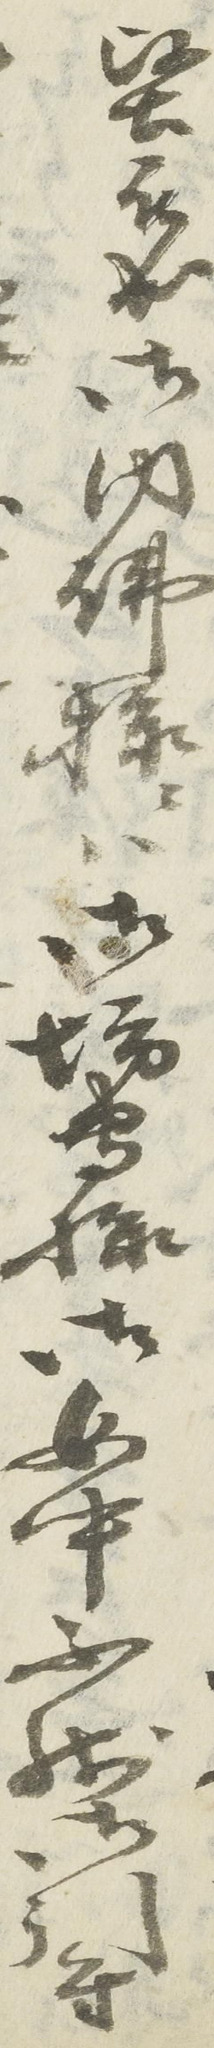堅被成御内仏様ニは御坊守様御女中不残御引付
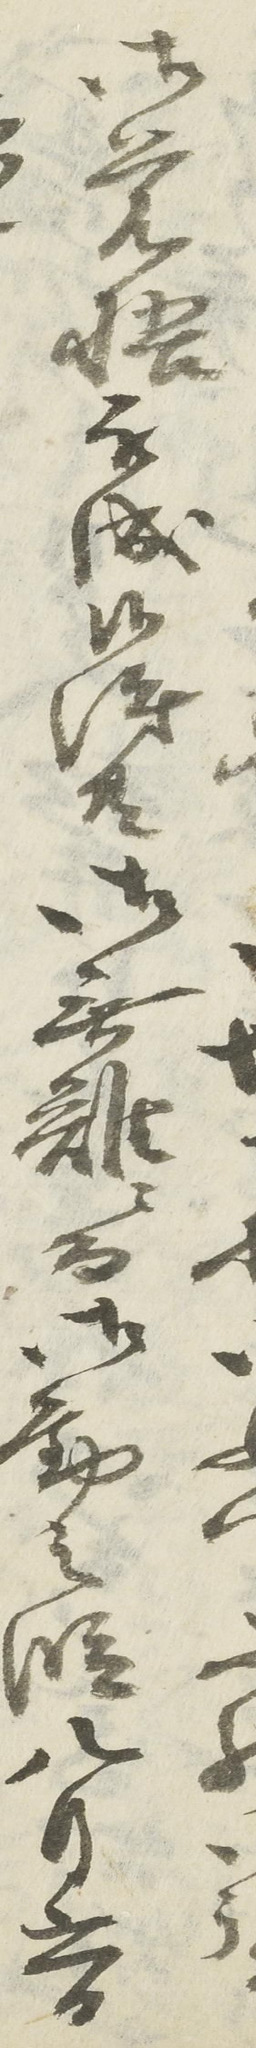御覚悟被成候得共御無難ニ而御動之段八月六日
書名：後見笑
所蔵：東京大学地震研究所図書室 Earthquake Research Institute Library, The University of Tokyo, JAPAN
